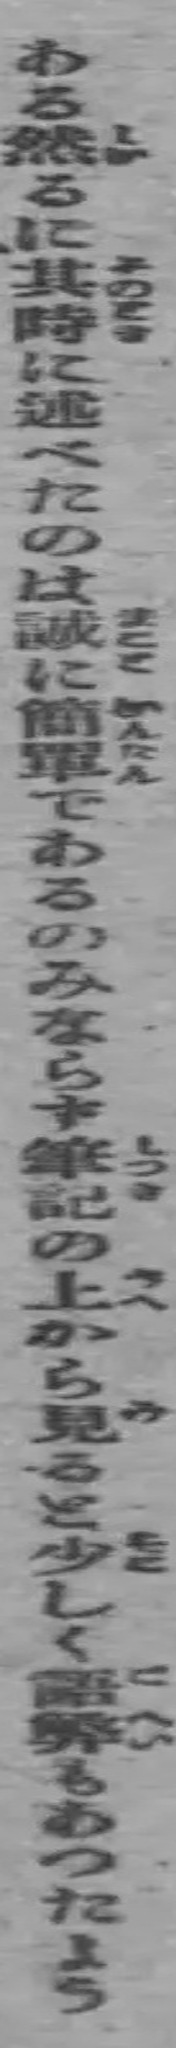ある然るに其時に述べたのは誠に簡単であるのみならず筆記の上から見ると少しく語弊もあつたよう
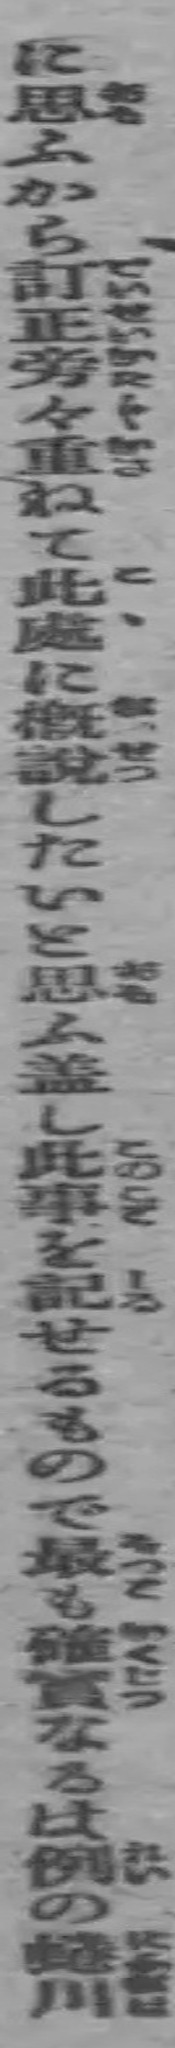に思ふから訂正旁々重ねて此処に概説したいと思ふ蓋し此事を記せるもので最も確実なるは例の蜷川
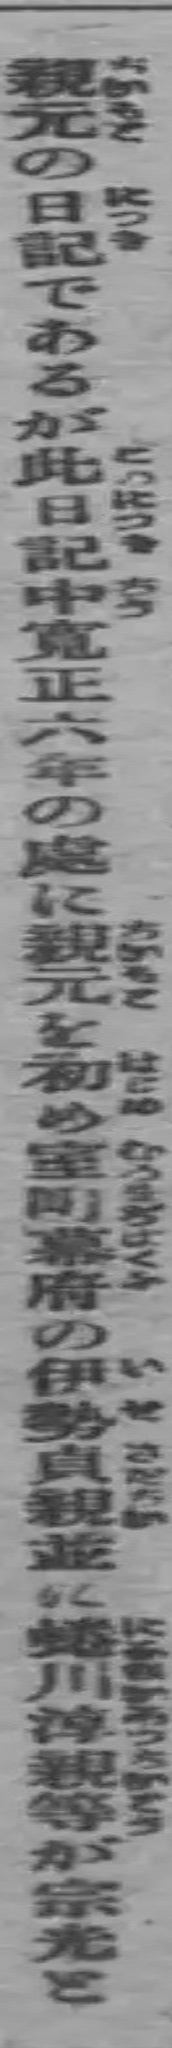親元の日記であるが此日記中寛正六の処に親元を初め室町幕府の伊勢貞親並に蜷川淳親等が宗光と
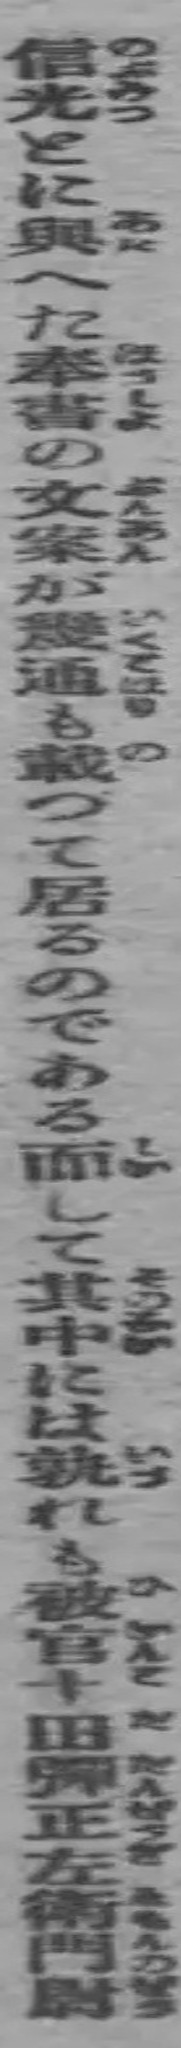信光とに与へた奉書の文案が幾通も載つて居るのである而して其中には孰れも被官十田弾正左衛門尉
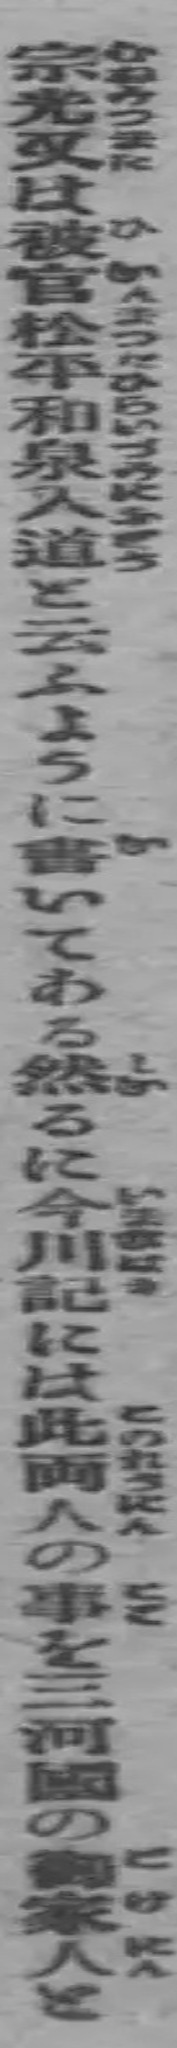宗光又は被官松平和泉入道と云ふように書いてある然るに今川記には此両人の事を三河国の御家人と
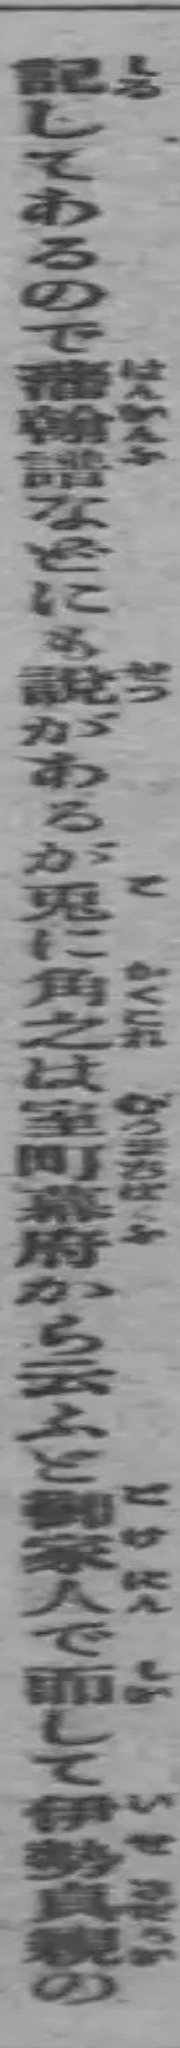記してあるので藩翰譜などにも説があるが兎に角之は室町幕府から云ふと御家人で而して伊勢貞親の
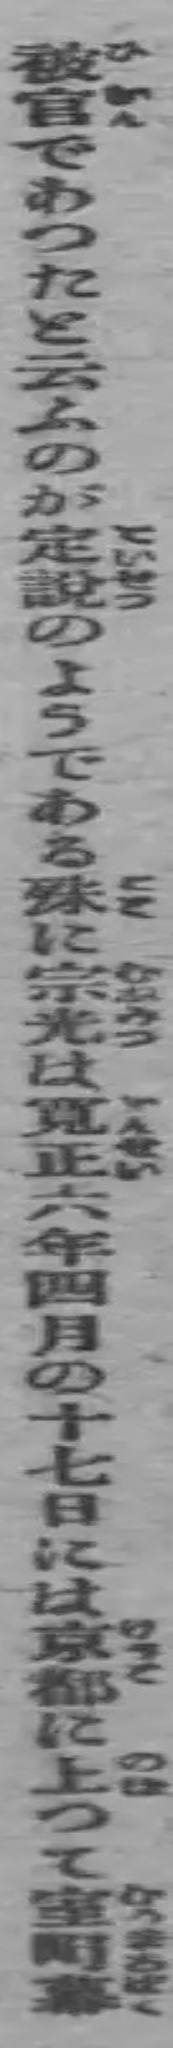被官であつたと云ふのが定説のようである殊に宗光は寛正六年四月の十七日には京都に上つて室町幕
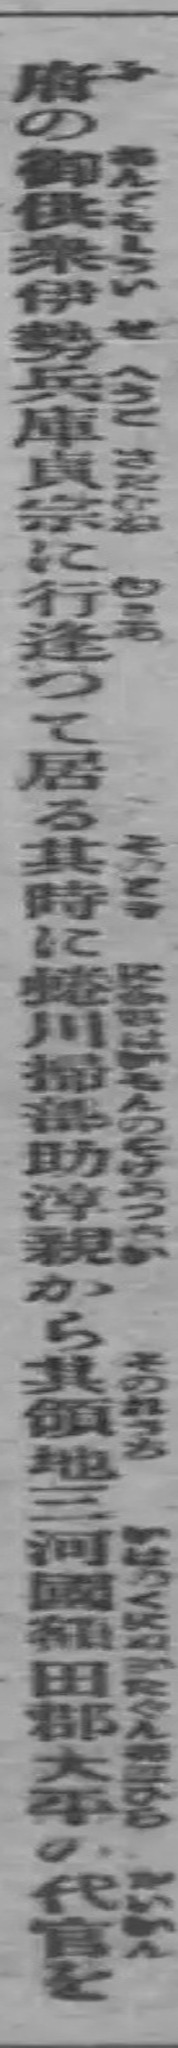府の御供衆伊勢兵庫貞宗に行逢つて居る其時に蜷川掃部助淳親から其領地三河国額田郡大平の代官を
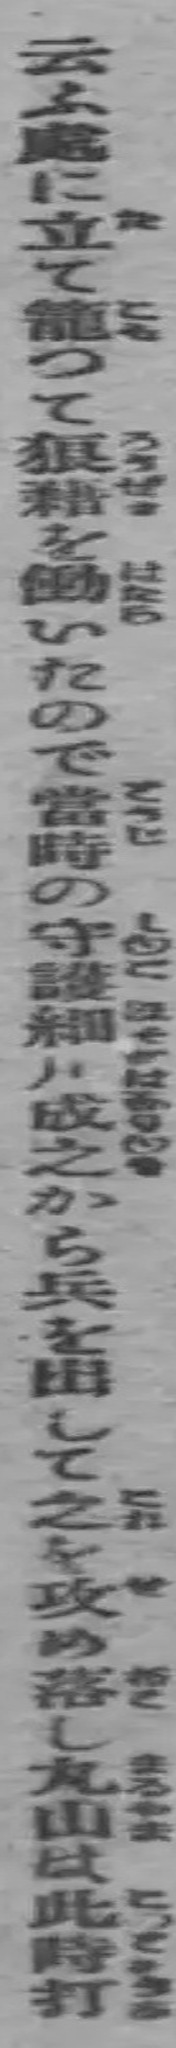云ふ処に立て籠つて狼藉を働いたので当時の守護細川成之から兵を出して之を攻め落し丸山は此時打
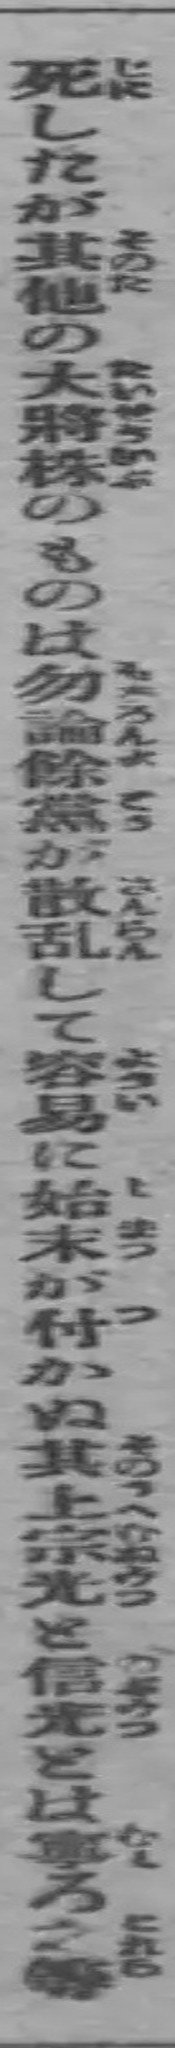死したが其他の大将株のものは勿論余党が散乱して容易に始末が付かぬ其上宗光と信光とは寧ろ之等
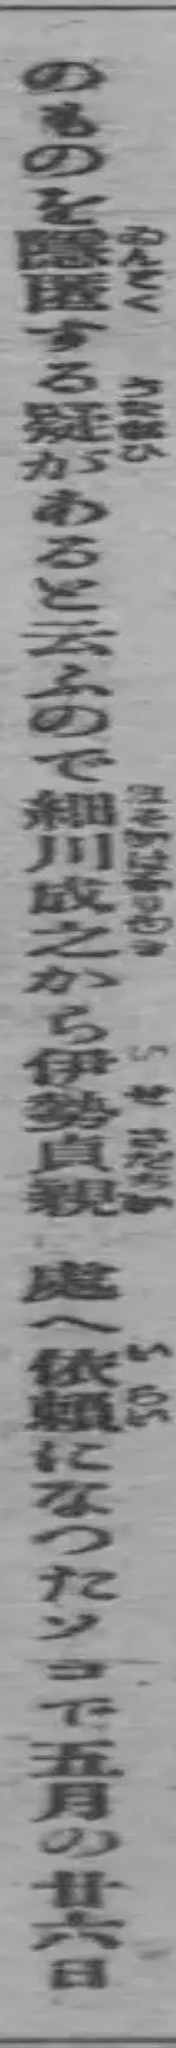のものを隠匿する疑があると云ふので細川成之から伊勢貞親の処へ依頼になつたソコで五月の廿六日
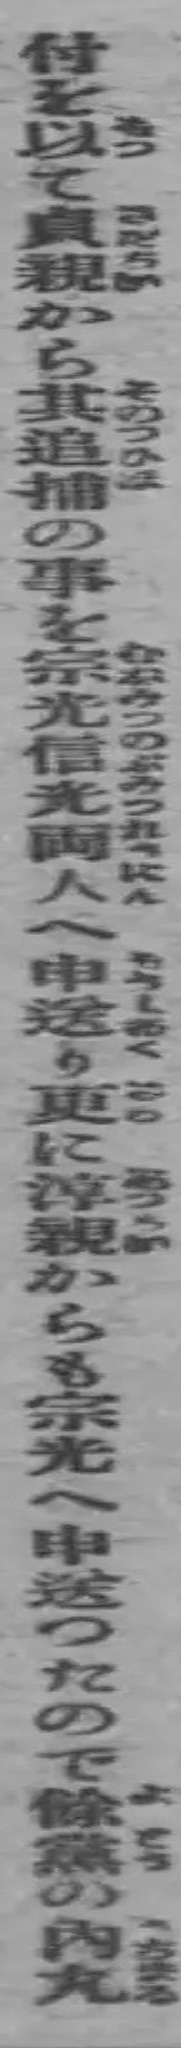付を以て貞親から其追捕の事を宗光信光両人へ申送り更に淳親からも宗光へ申送つたので余党の内丸
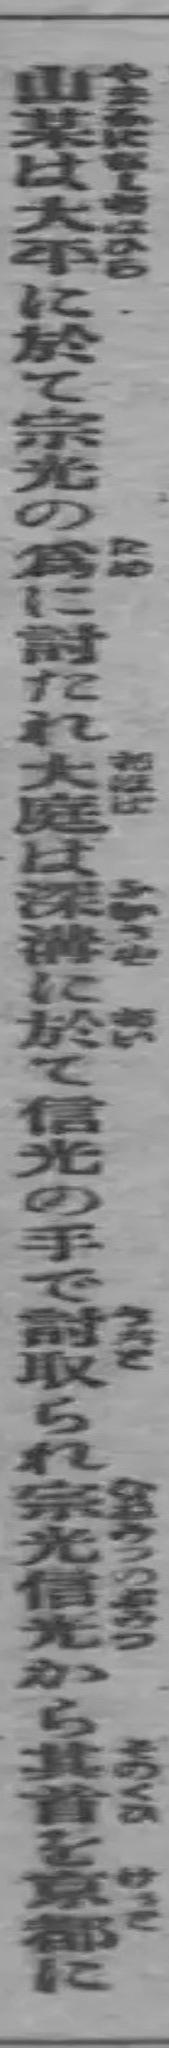山某は大平に於て宗光の為に討たれ大庭は深溝に於て信光の手で討取られ宗光信光から其首を京都に

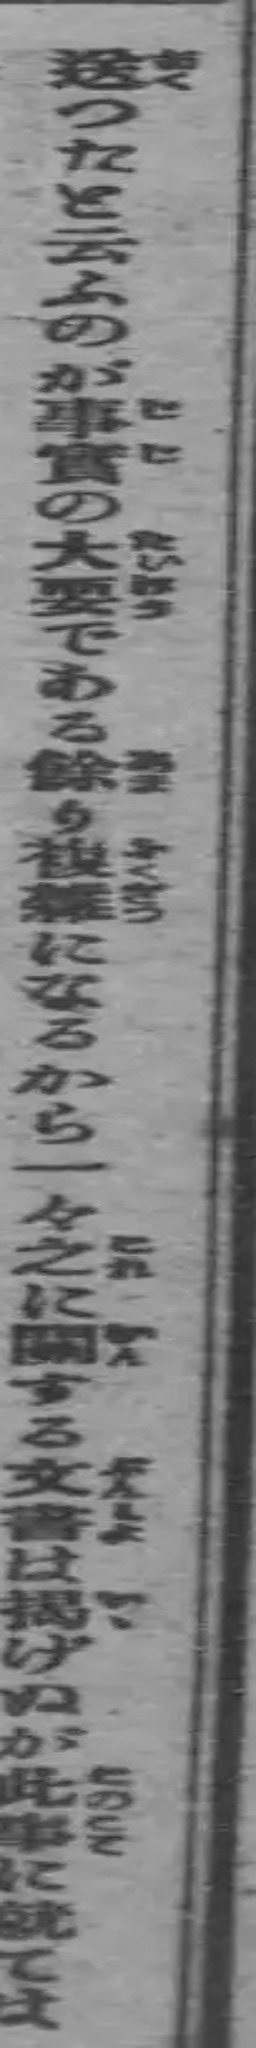送つたと云ふのが事実の大要である余り複雑になるから一々之に関する文書は掲げぬが此事に就ては
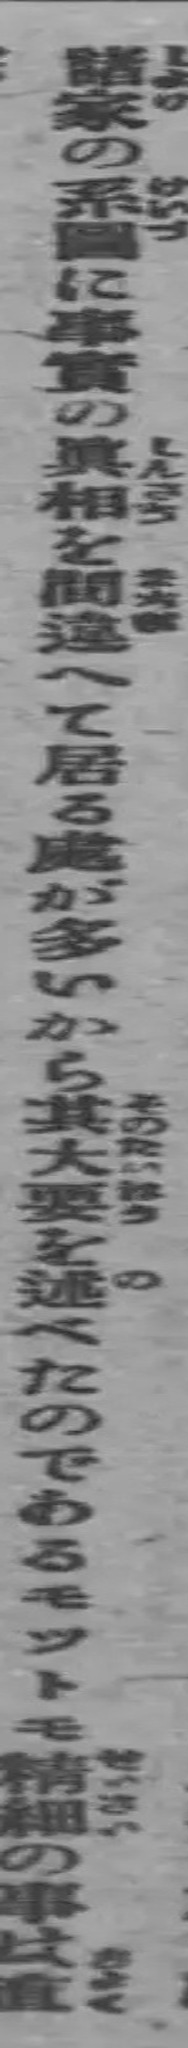諸家の系図に事実の真相を間違へて居る処が多いから其大要を述べたのであるモツトモ精細の事は直
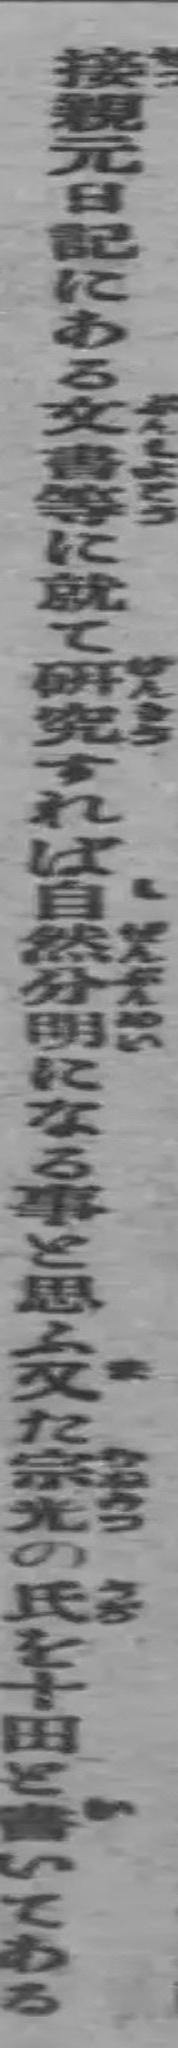接親元日記にある文書等に就て研究すれば自然分明になる事と思ふ又た宗光の氏を十田と書いてある
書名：豊橋市史談
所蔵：国立国会図書館 National Diet Library, JAPAN
